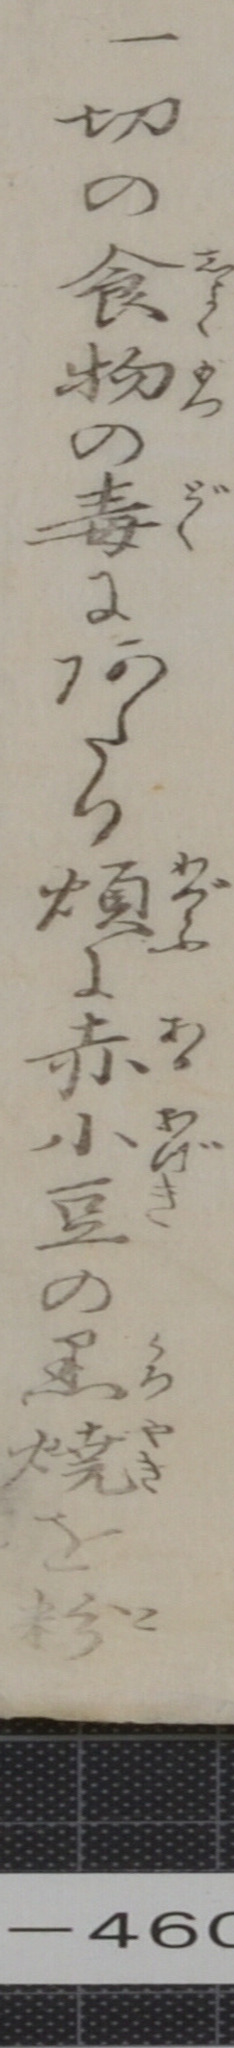一一切の食物の毒にあたり煩に赤小豆の黒焼を粉
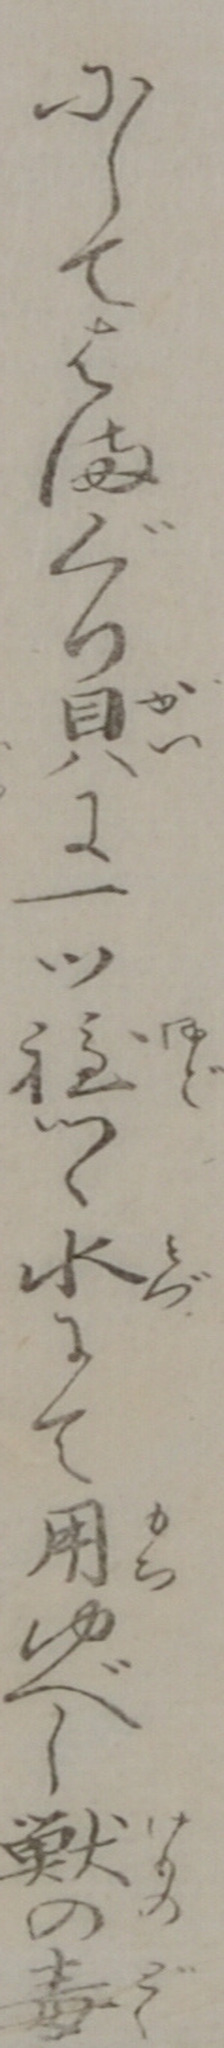にしてはまぐり貝に一ツ程ツゝ水にて用ゆべし獣の毒
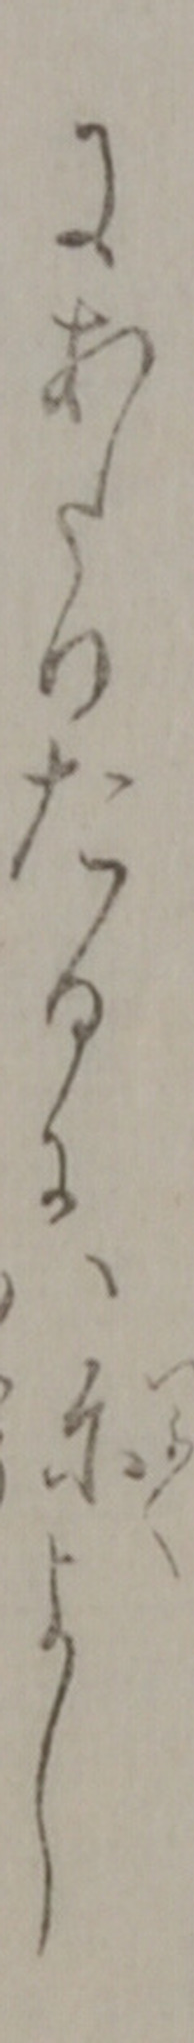にあたりたるには弥よし
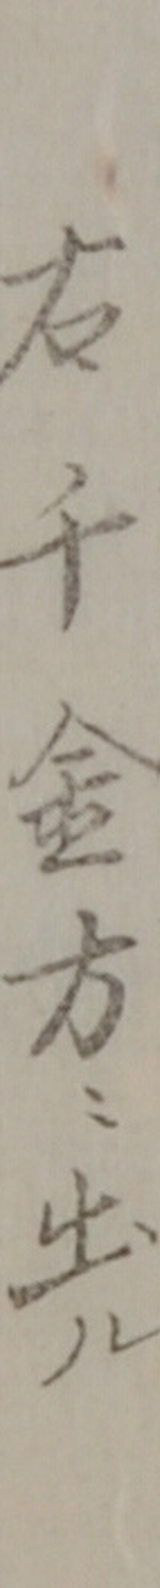右千金方に出ル
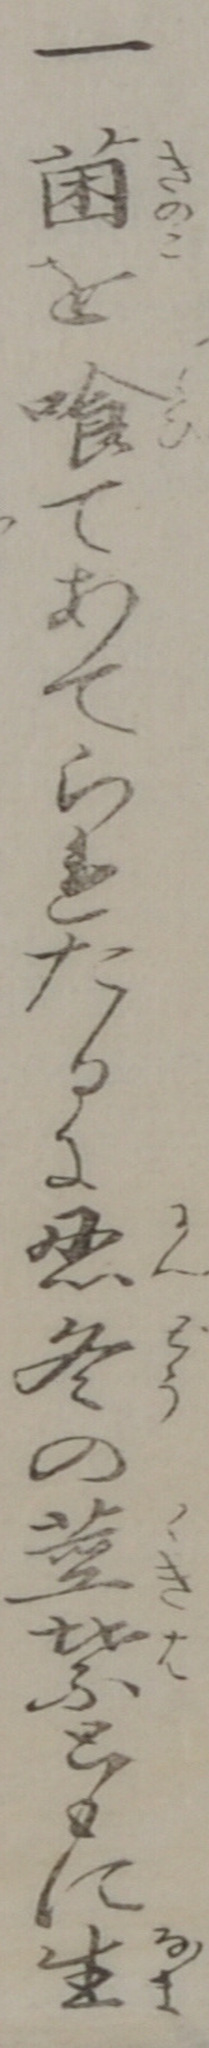一菌を喰てあてられたるに忍冬の茎葉ともに生
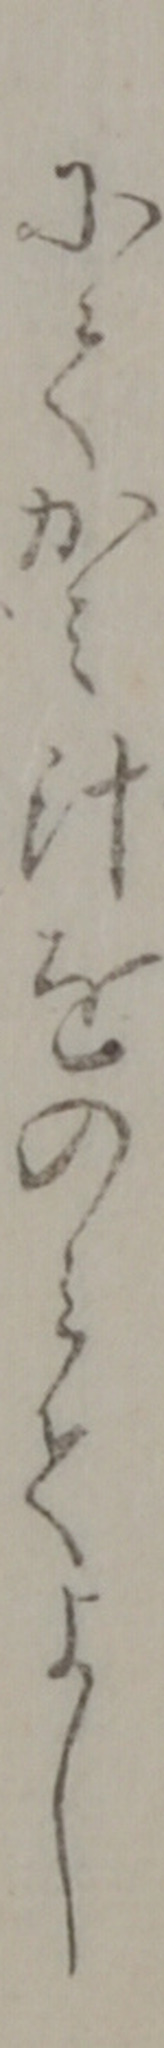にてかみ汁をのみてよし
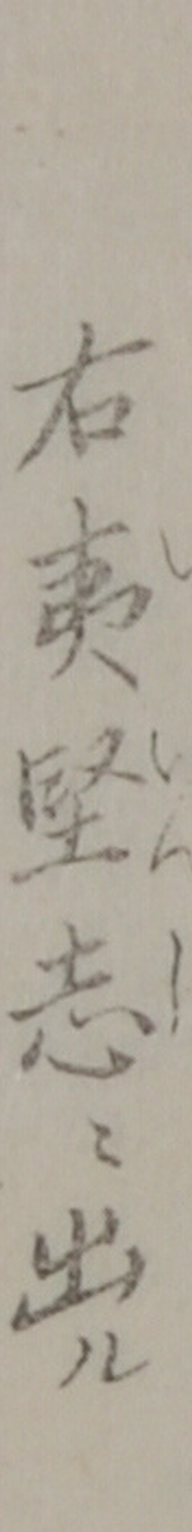右夷堅志に出ル
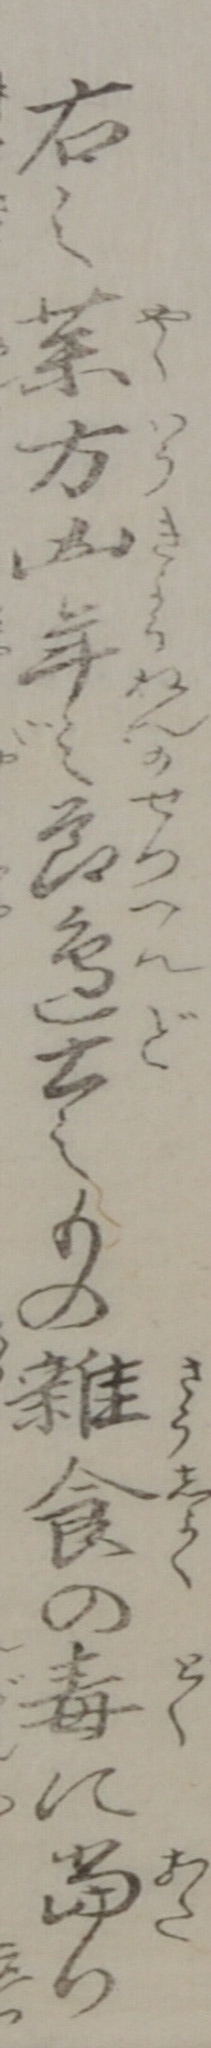右之薬方凶年之節辺土之もの雑食の毒に当り
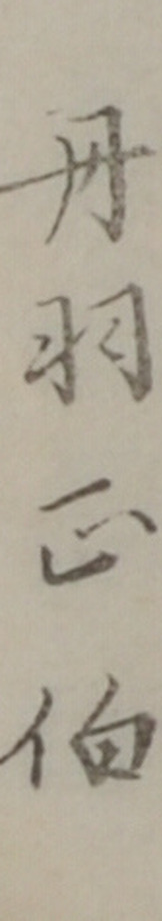丹羽正伯

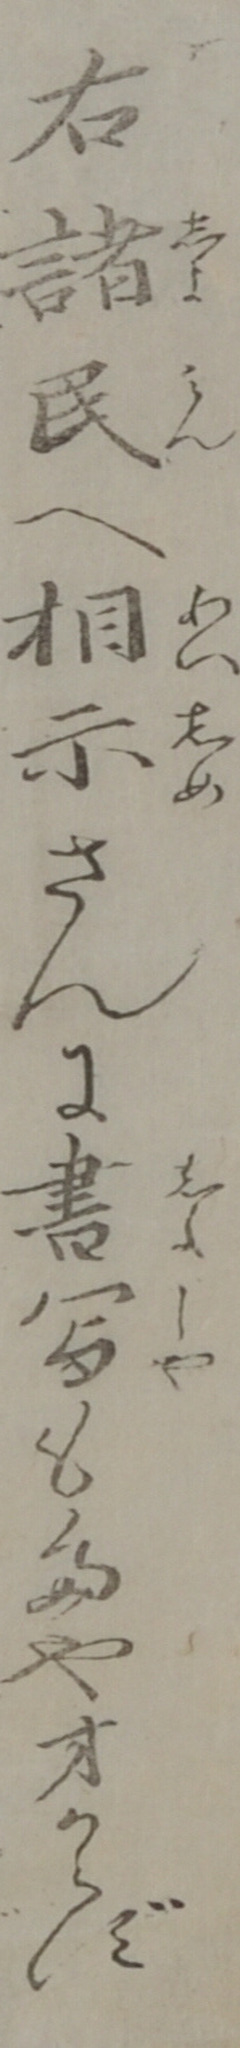右諸民へ相示さんに書写もたやすからず
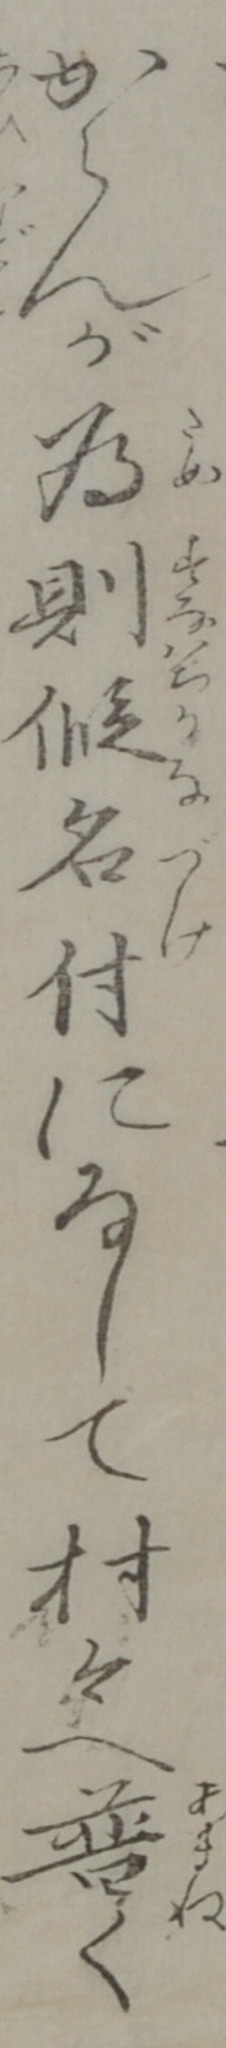からんが為則仮名付になして村々へ普く
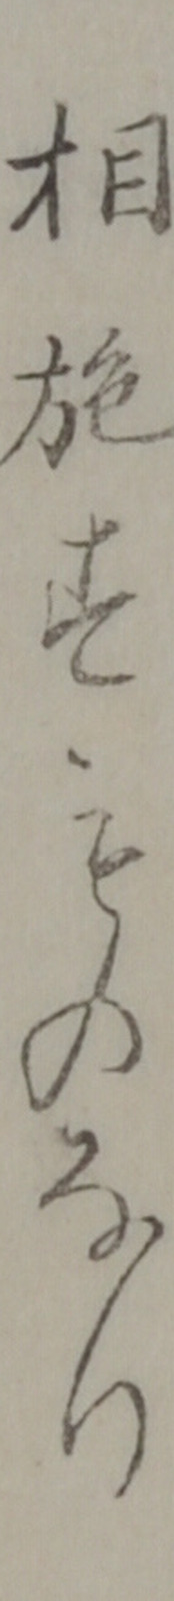相施すものなり
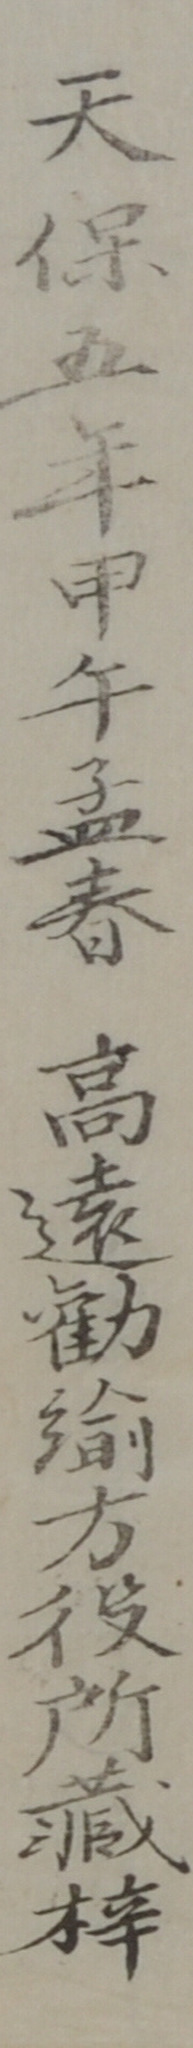天保五年甲午孟春高遠勧諭方役所蔵梓
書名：簡便方
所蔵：伊那市立高遠町図書館・合同会社AMANE
